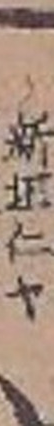新垣仁ヤ
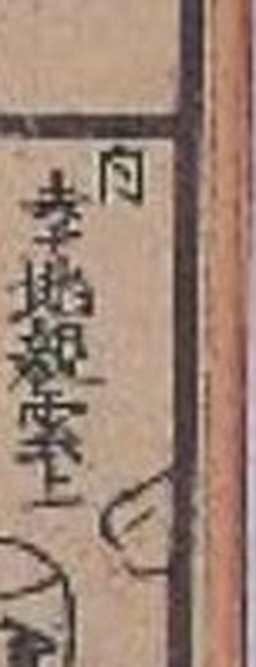幸地親雲上
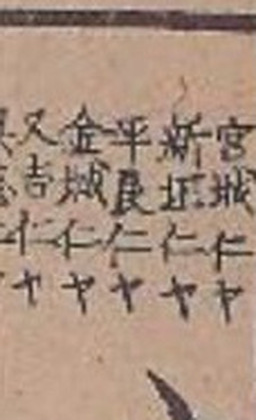平良仁ヤ
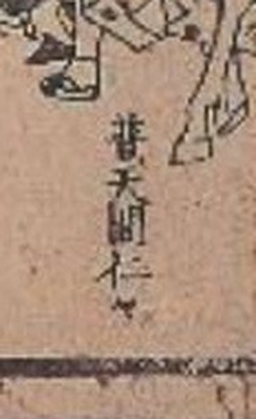普天間仁ヤ
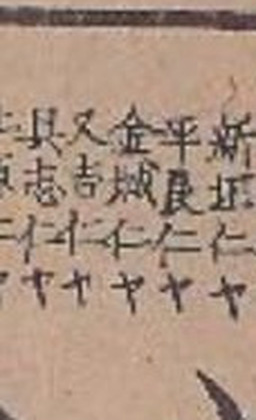金城仁ヤ
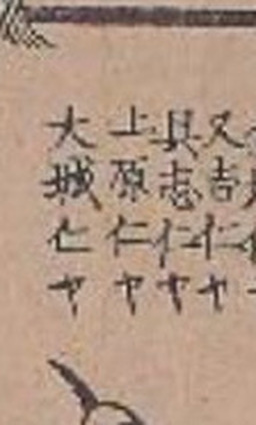上原仁ヤ
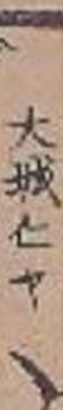大城仁ヤ
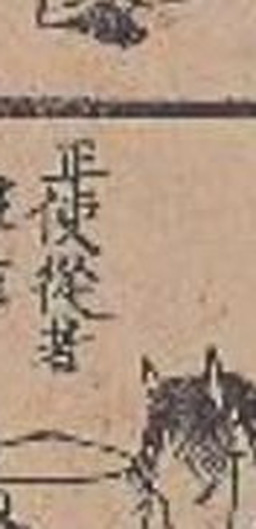正使従者
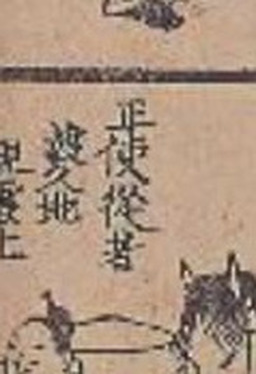正使従者
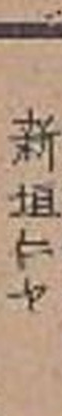新垣仁ヤ
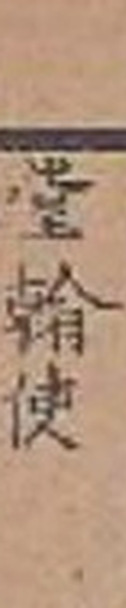掌翰使
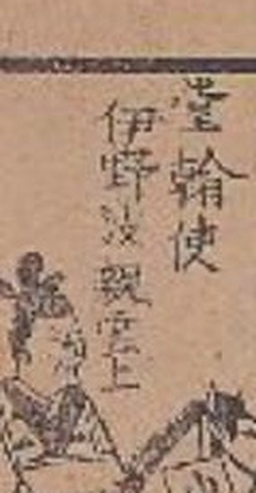伊野波親雲上
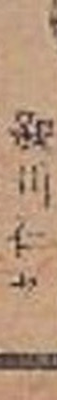親川仁ヤ
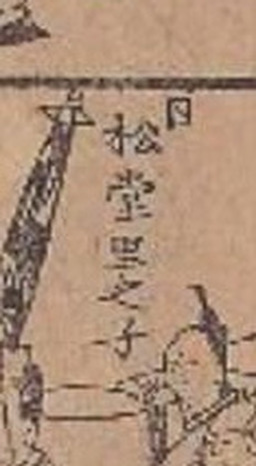松堂里之子
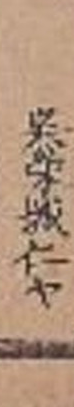真栄城仁ヤ
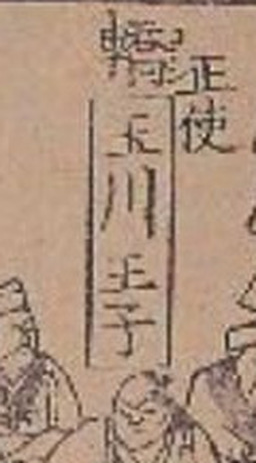轎玉川王子
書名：琉球人行列附 嘉永三庚戌年十一月
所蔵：University of the Ryukyus Library
